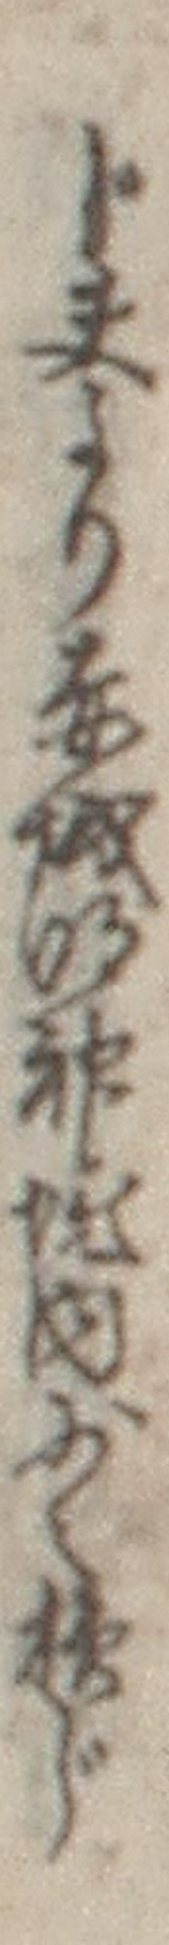じ夫より赤城明神境内少〻損じ
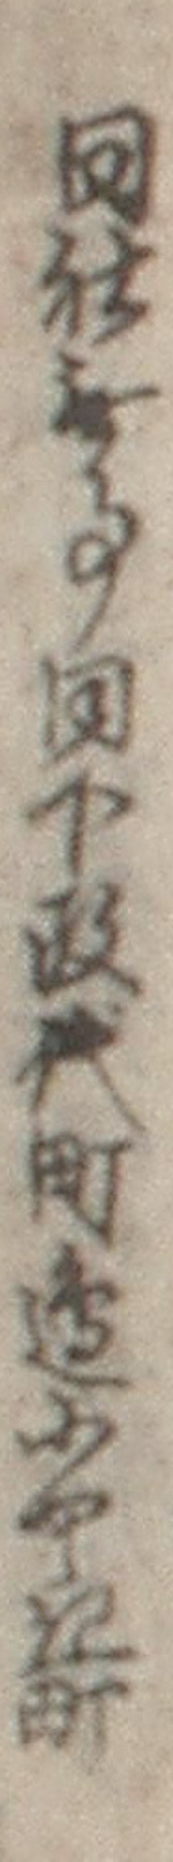同社無事同下政代町邊小やしき町
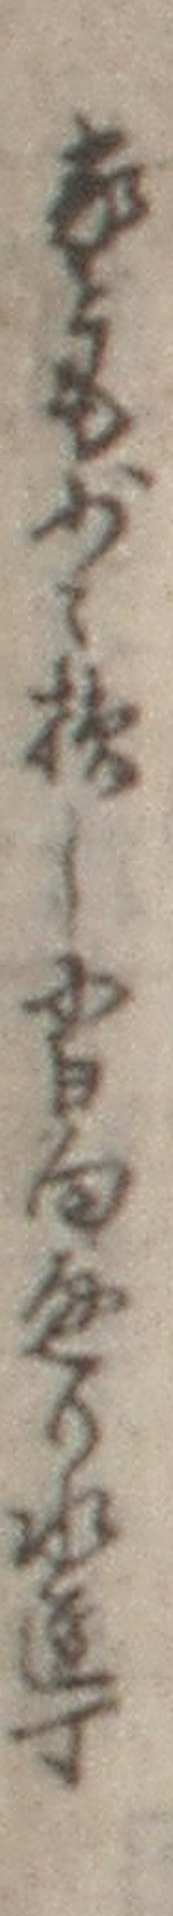家とも少〻損し小日向通り水道丁

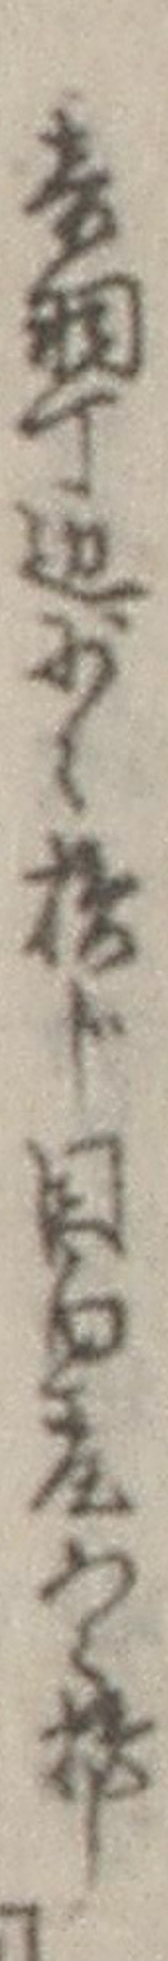寿羽丁辺少〻損じ目白臺少〻損し
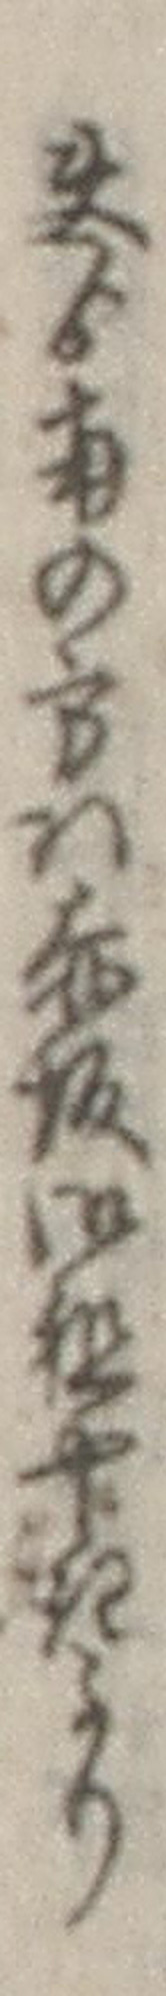夫ゟ南の方は赤坂御組やしきより
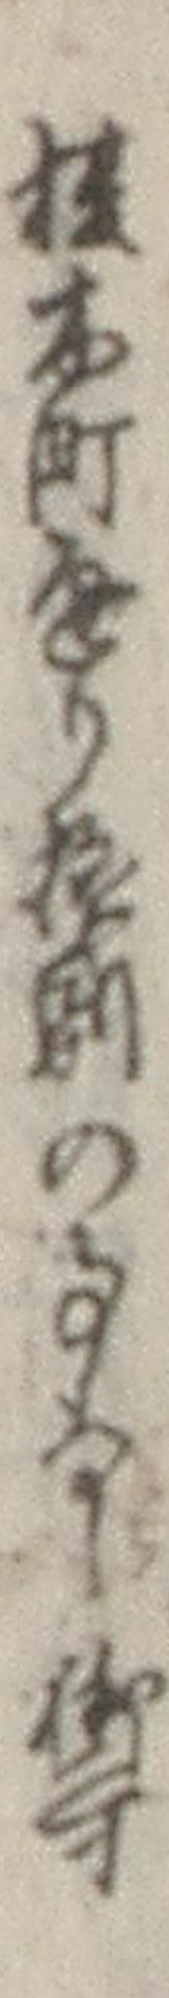榎木町通り格別の事なし御守
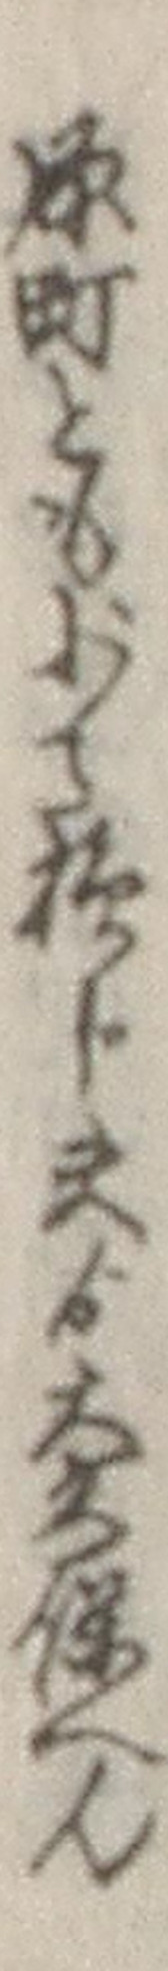原町とも少〻損じ夫ゟ大久保へん
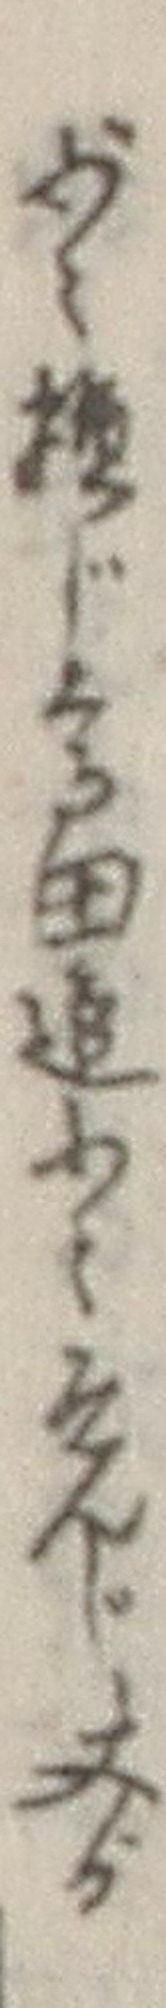少〻損じ高田邊少〻そんじ夫ゟ
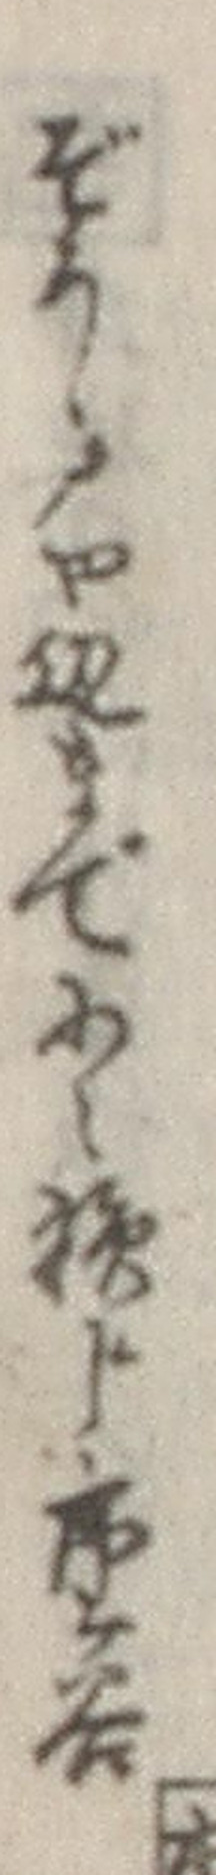ぞうしかや辺まで少〻損じ市ヶ谷
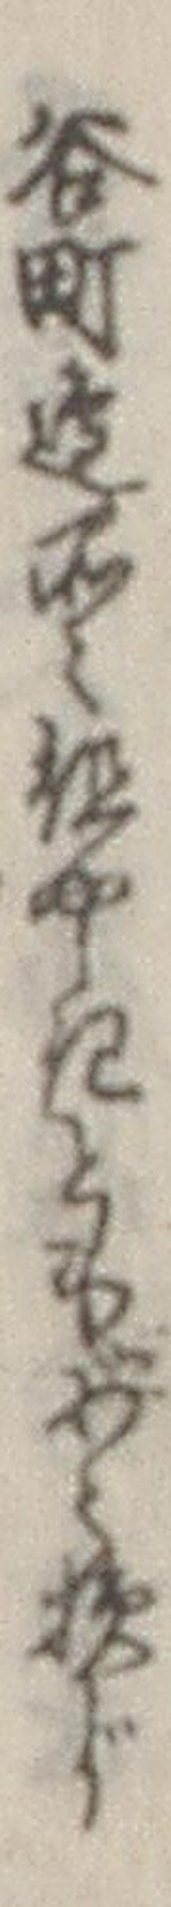谷町邊所〻組やしきとも少〻損じ
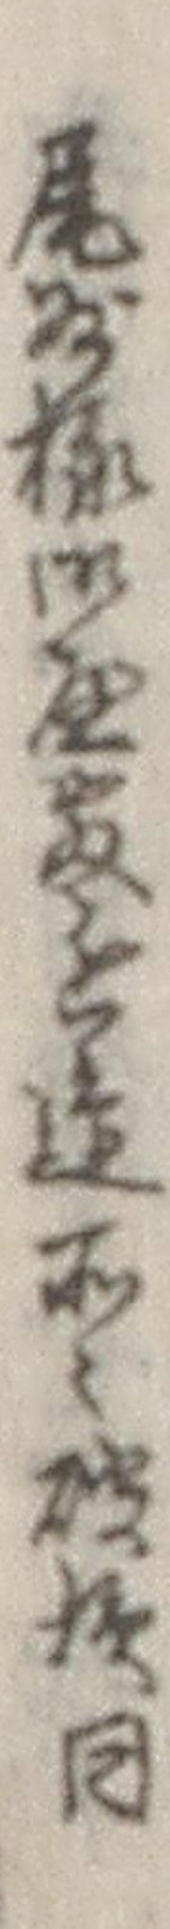尾州様御屋敷近邊所〻破損同
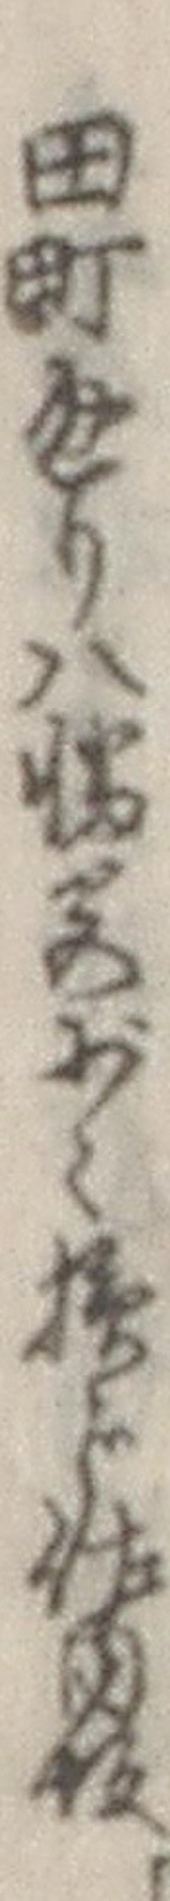田町通り八幡宮少〻損じ佐内坂
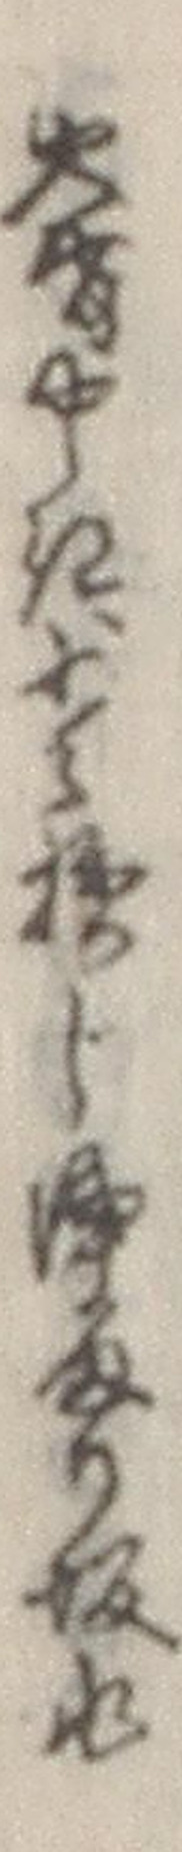火省？やしき少〻損じ津留り坂水
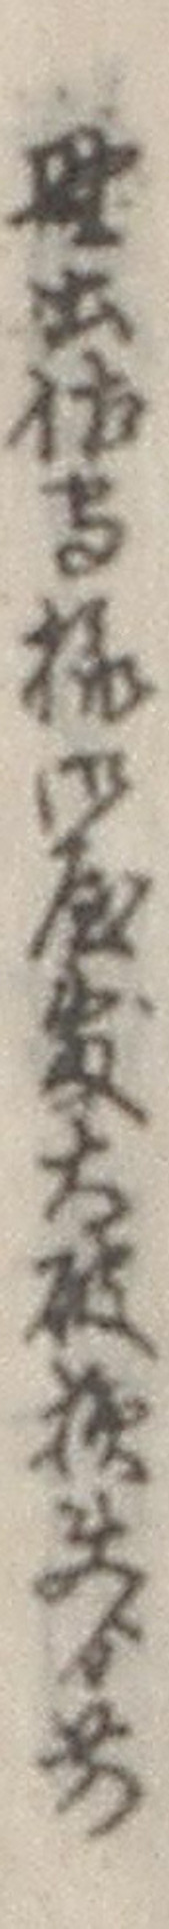野土佐守様御屋敷大破損夫ゟ前
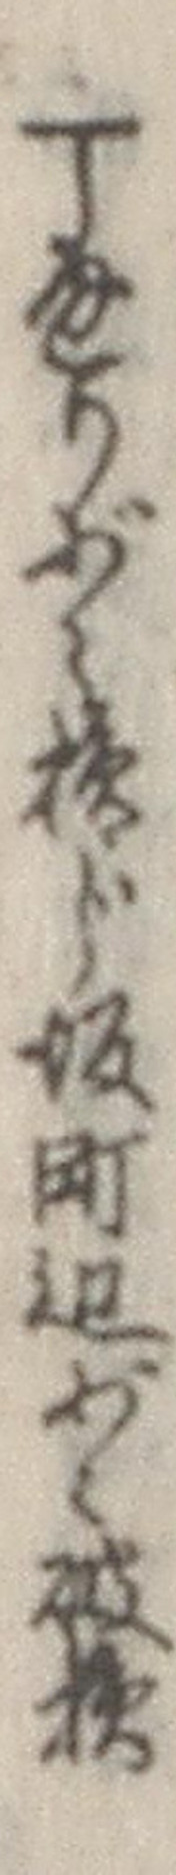丁通り少〻損じ坂町辺少〻破損
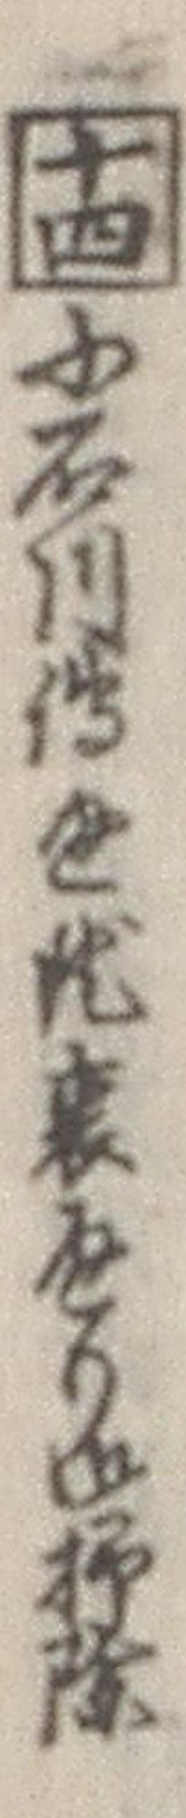十四小石川傳通院裏通り御掃除
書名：江戸　大地震臣細録　全
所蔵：東京大学地震研究所図書室 Earthquake Research Institute Library, The University of Tokyo, JAPAN
